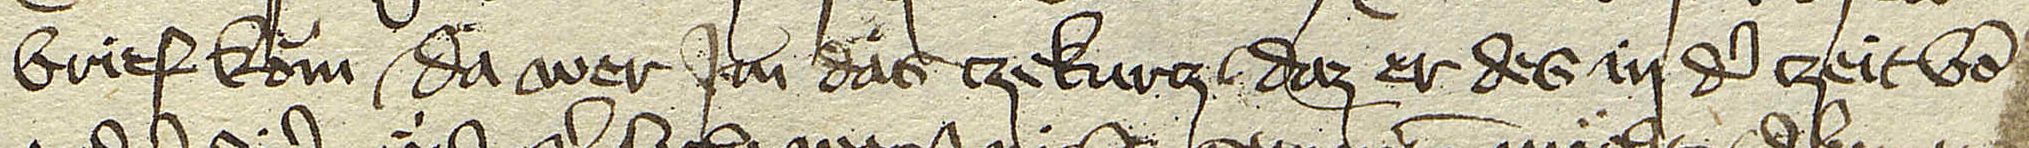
brief köm / da wer Im das cʒekurcʒ / daʒ er des in d* cʒeit vo*
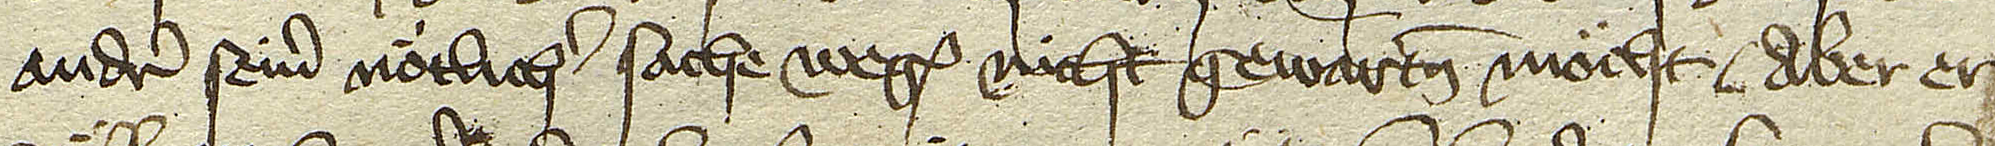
andr* ſein* nötlich* ſache weg* nicht gewartn* möcht / Aber er
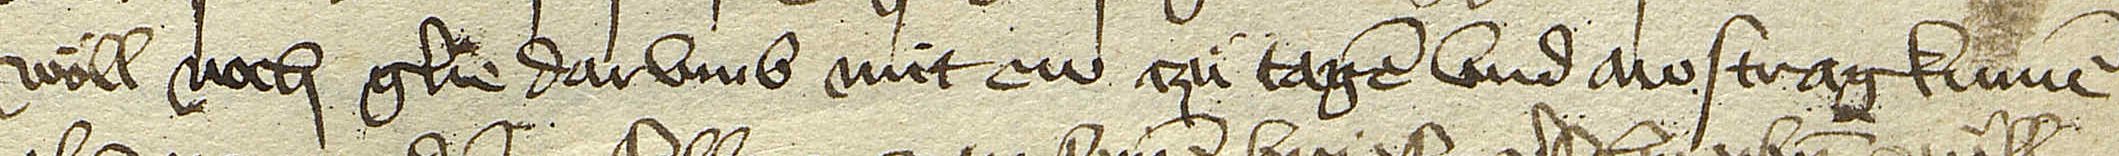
wöll noch g*ne darvmb mit ew cʒü tage* vnd awſtrag kume*
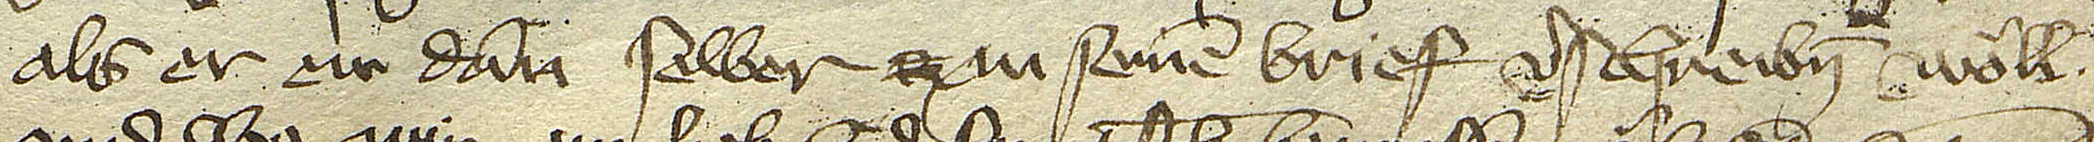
als er ew dan* ſelber an ſeine* brief v*ſchreibn* wöll
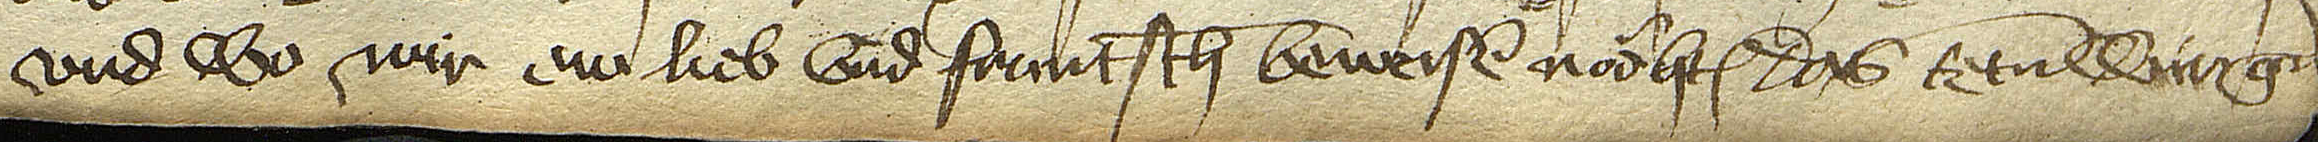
vnd wo wir ew lieb vnd fruntſch* beweiſe* möht* das tetn* wir g*n
